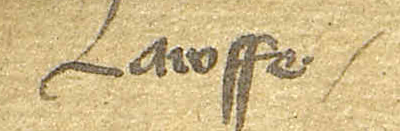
Lawffe . /
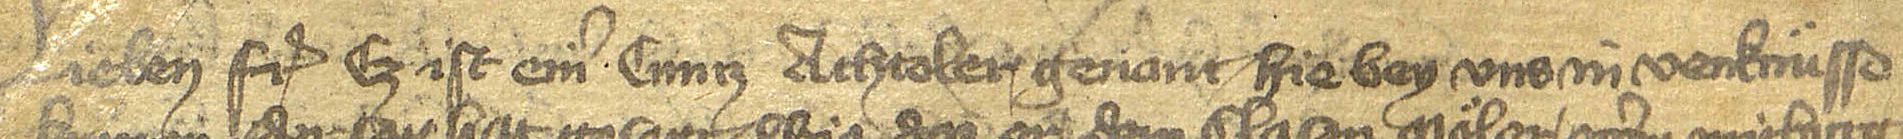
Liebn fr* Eʒ iſt ein* Cuncʒ Achtoler genant hie bey vns in venknüſſe
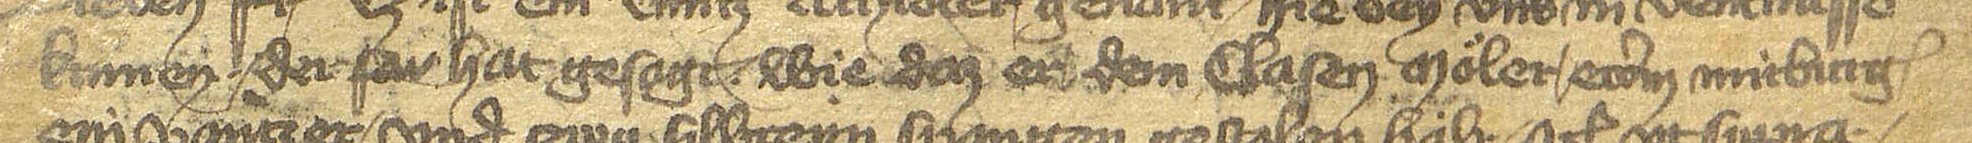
kumen . / der ſa hat geſagt / . wie daʒ er dem Claſen Möler / ew*m mitburg*
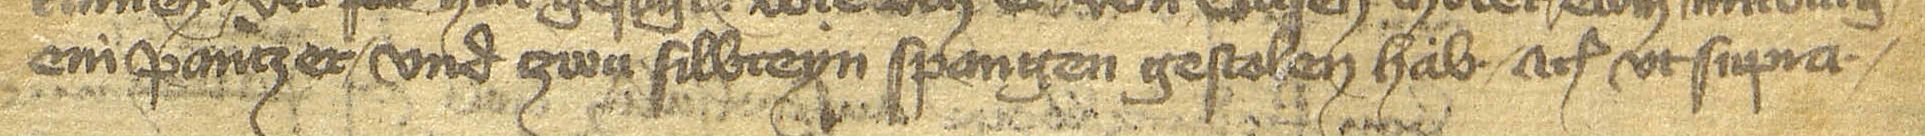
ein pancʒer / vnd cʒwu ſilbreyn ſpangen geſtolen hab . / ec* vt ſupra . /
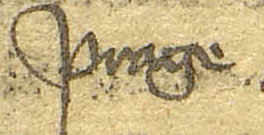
Prage
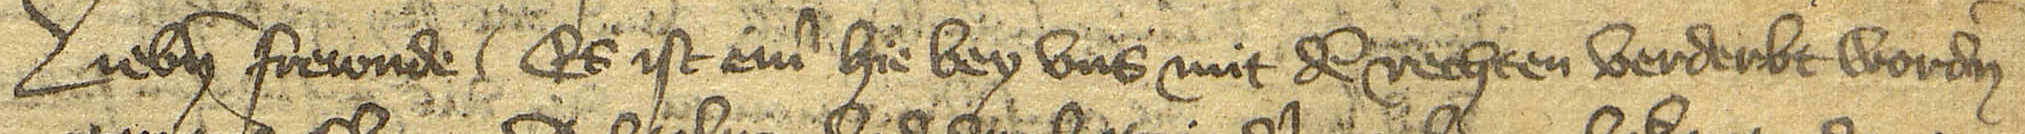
Liebn* frewnde / Es iſt ein* hie bey vns mit d* rechten verderbt wordn*
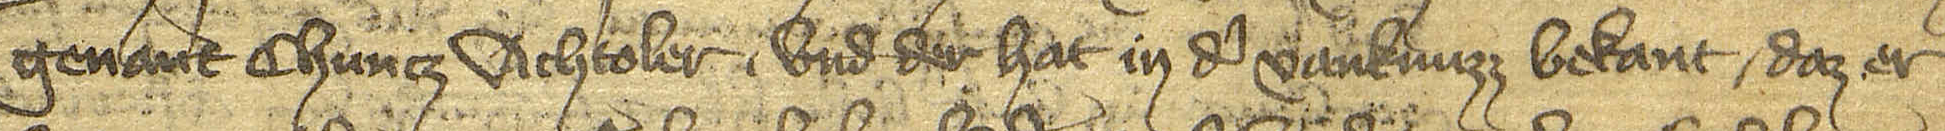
genant Chuncʒ Achtoler / vnd der hat in d* vanknuʒʒ bekant / daʒ er
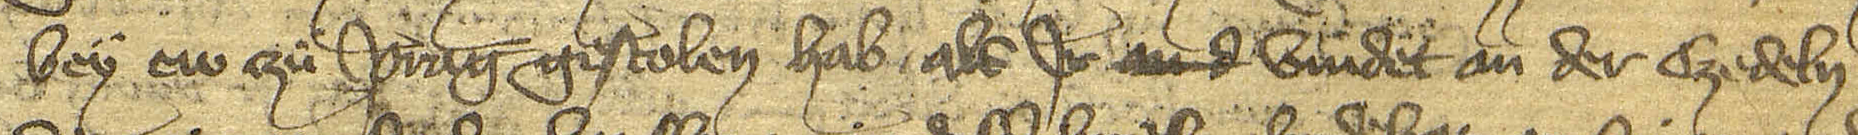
bey ew cʒü Prag geſtolen hab / als Ir an d vindet an der Cʒedeln
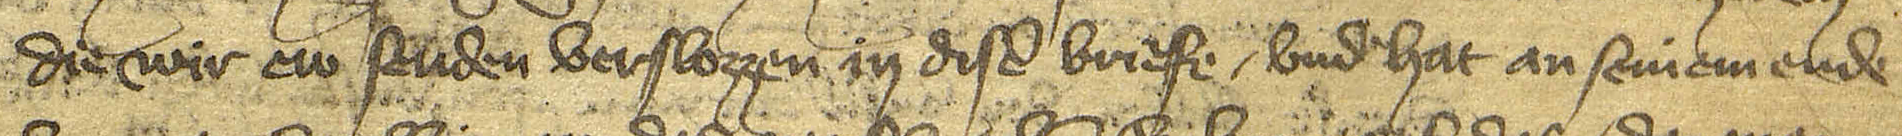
die wir ew ſenden verſloʒʒen in diſe* briefe / vnd hat an ſeinem ende
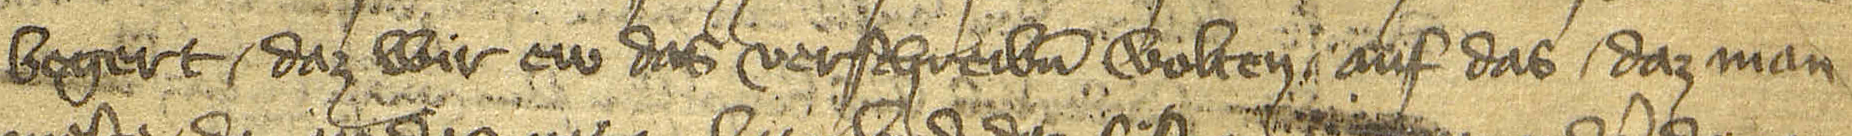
begert / daʒ wir ew das verſchreibn* wolten / auf das / daʒ man
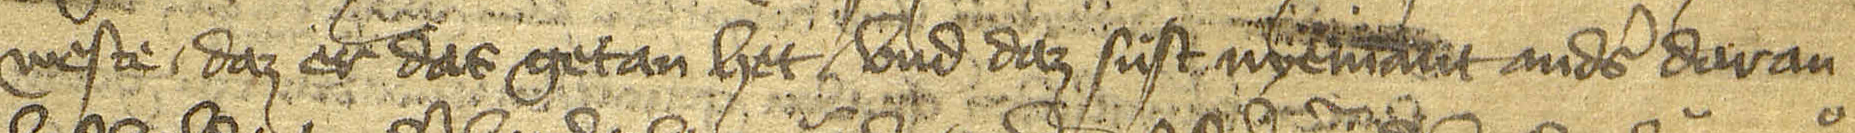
weſte / daʒ er das getan het / vnd daʒ ſüſt nyemant ands* daran
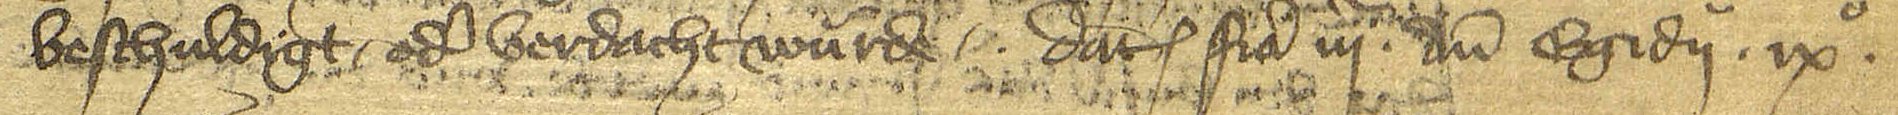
beſchuldigt / od* verdacht würde / . Dat* fia* iii* an* Egidii . ix* .
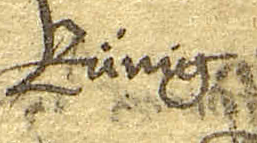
Künig
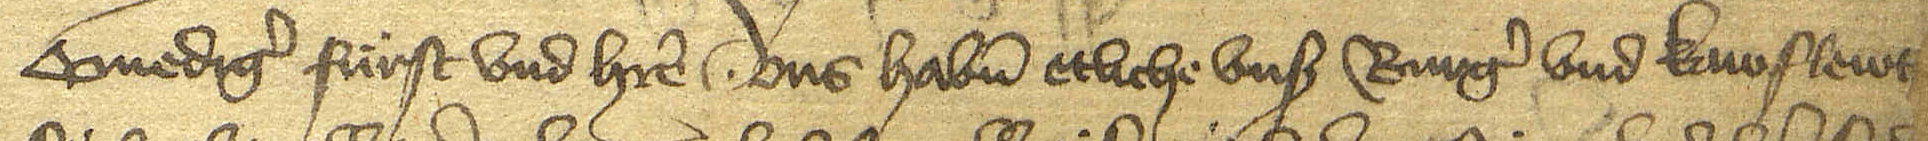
Gnedig* fürſt vnd hr*e / . Vns habn* etliche vnſ* Burg* vnd kawflewt
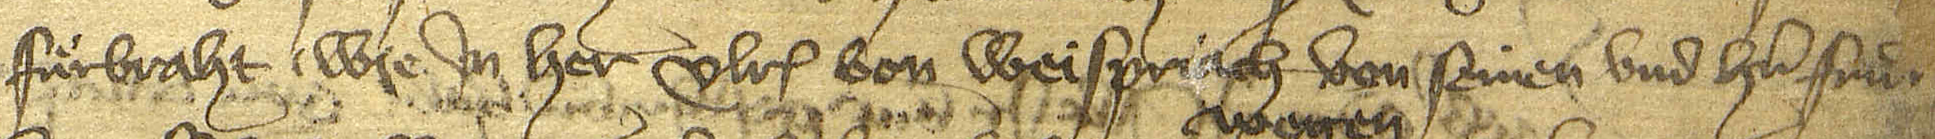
fürbraht / wie In her vlr* von weiſpriach von ſeinen vnd hn* fridr*
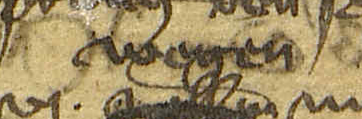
wegen
